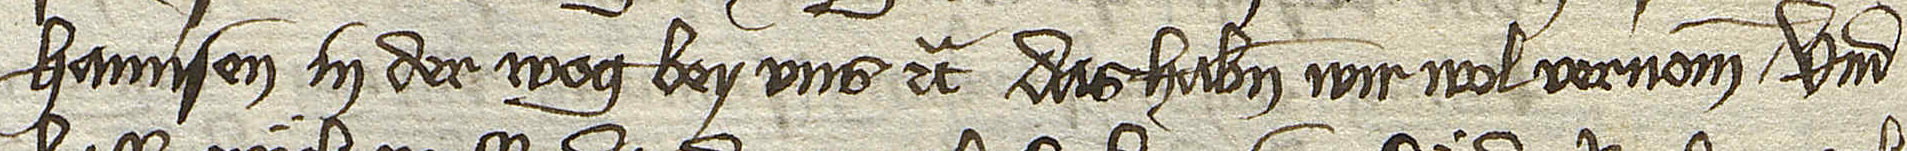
hannſen in der wog bey vns ec* Das habn* wir wol vernom* / Vnd
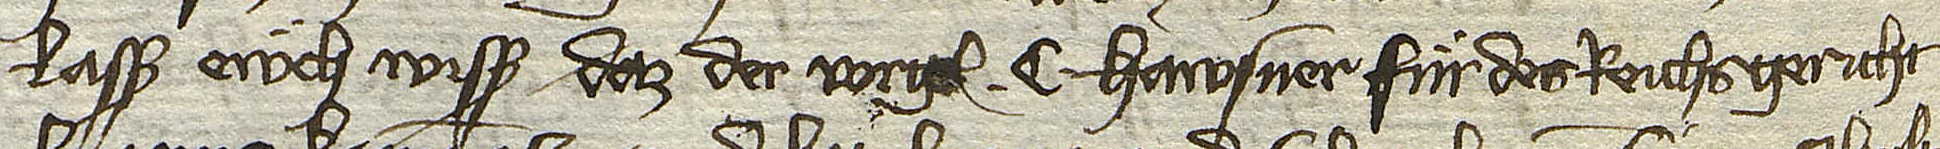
laſſ* eẅch wiſſ* / daʒ der vorg* . C . hawſner für des Reichs gericht
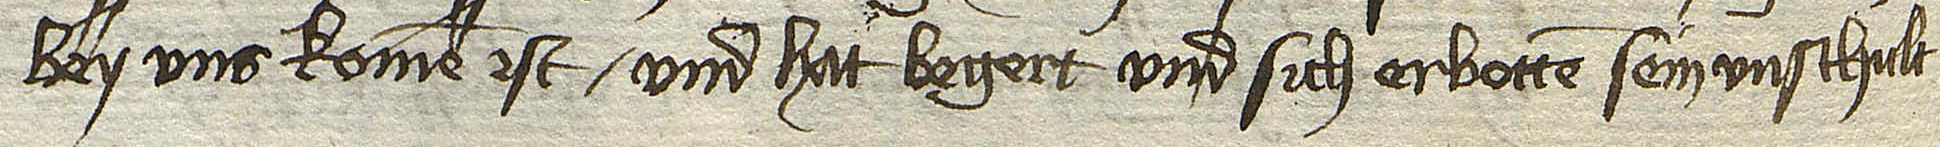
bey vns kome* iſt / vnd hat begert vnd ſich erbotte* ſein vnſchult
